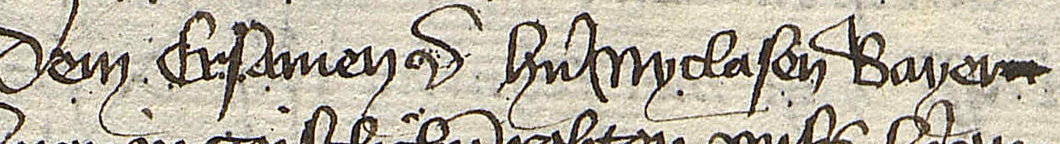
Dem Erſamen ec* hn* Nyclaſen Bayern
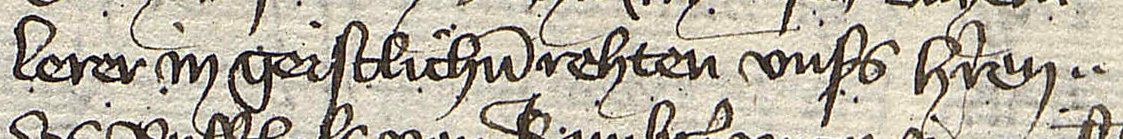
lerer in geiſtlichn* rehten vnſ*s h*ren ~
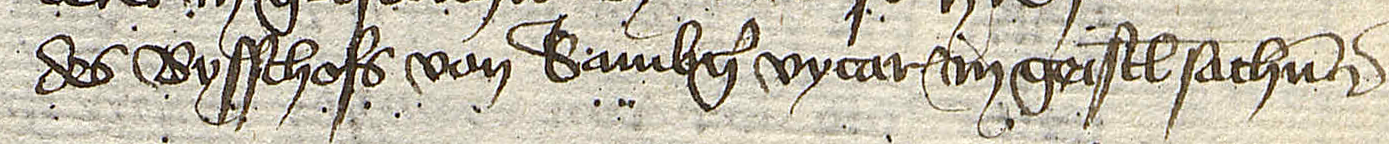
des Byſſchofs von Bamb*g vycar* in geiſtl* ſachn* ec*
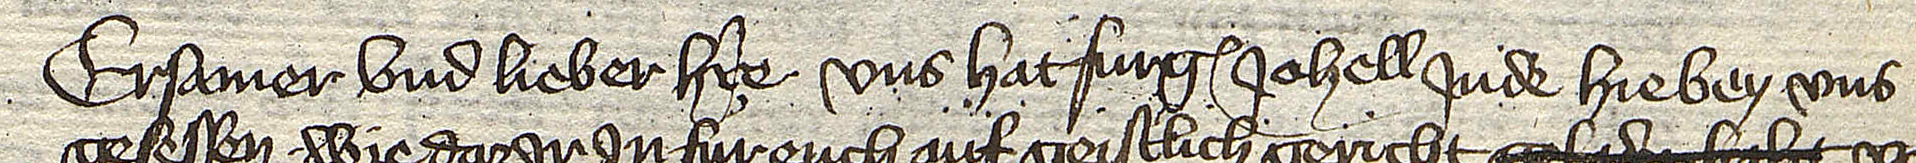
Erſamer vnd lieber h*re vns hat furg* Iohell Iude hie bey vns
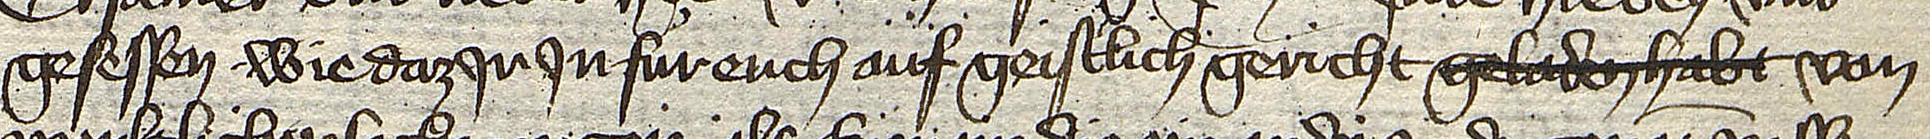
geſeſſen / wie daʒ Ir In für euch auf geiſtlich gericht geladen habt von
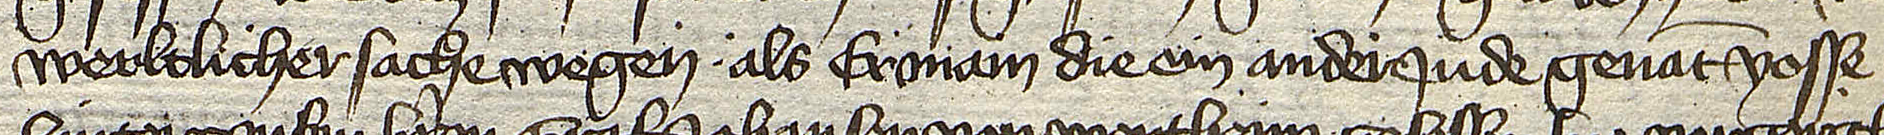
werltlicher ſache wegen . als Er main die ein ander Iude gena*t yoſſe
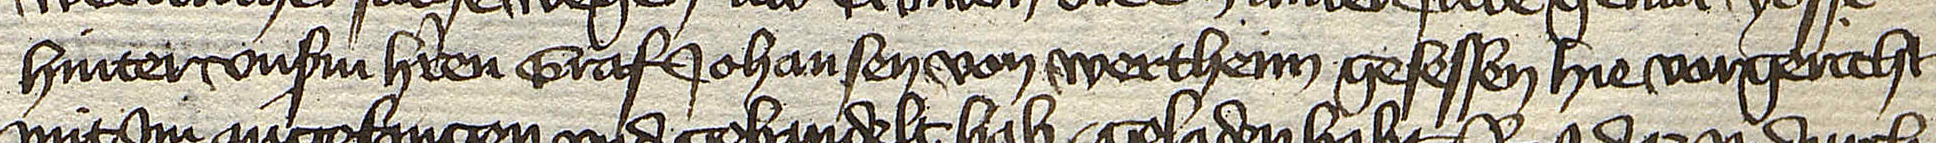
hinter vnſ*m h*ren Graf Iohanſen von wertheim geſeſſen hie vorgericht
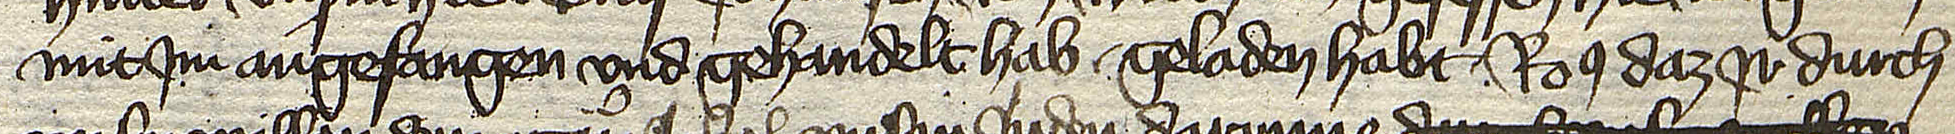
mit Im angefangen vnd gehandelt hab / geladen habt / Ro* daʒ Ir durch
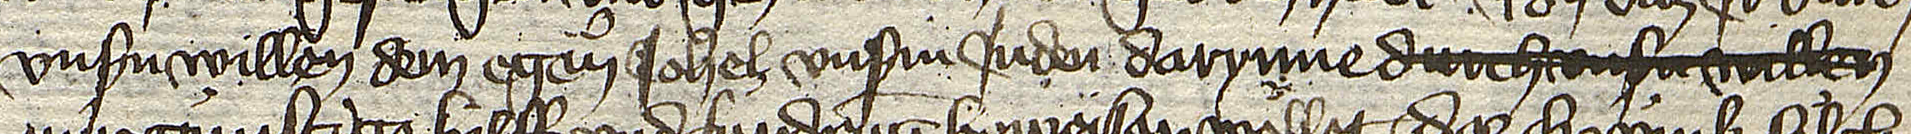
vnſ*n willen dem egen* Iohel vnſ*m Iuden darynne durch vnſ*n willen
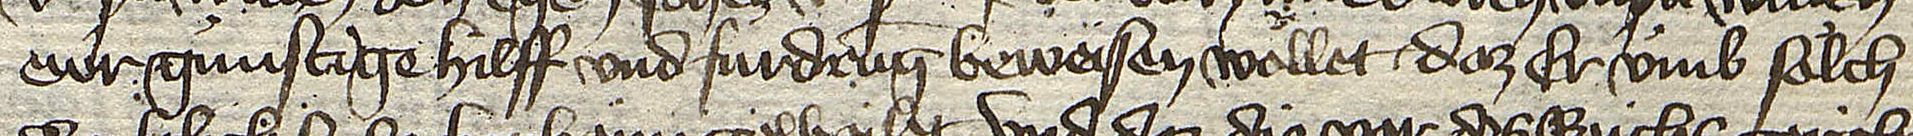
eẅr günſtige hilff vnd fürdru*g beweiſen wöllet / daʒ Er v̈mb ſölich
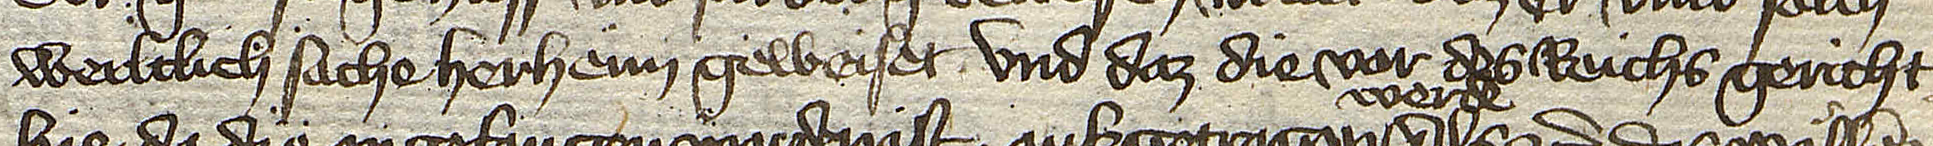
wertlich ſache herheim geweiſet vnd daʒ die vor des Reichs gericht
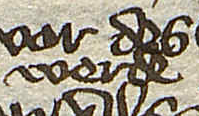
werde
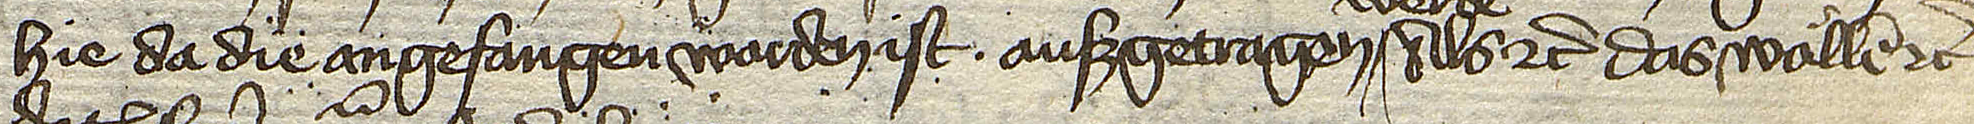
hie da die angefangen worden iſt . auſʒgetragen Als ec* Das wölle* ec*
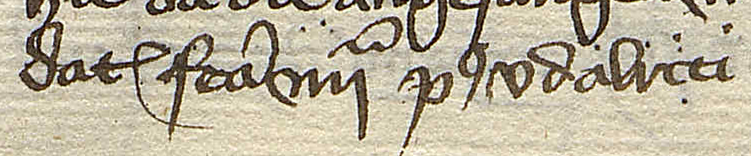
dat* fea* iiii* p* vdalrici
